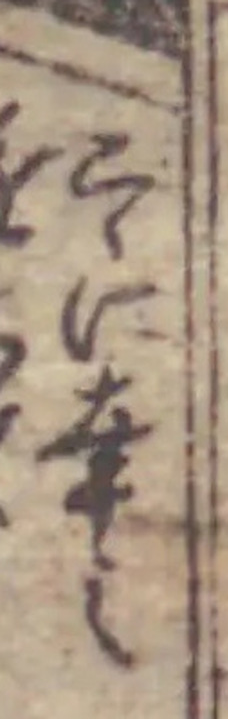こゝに幸之
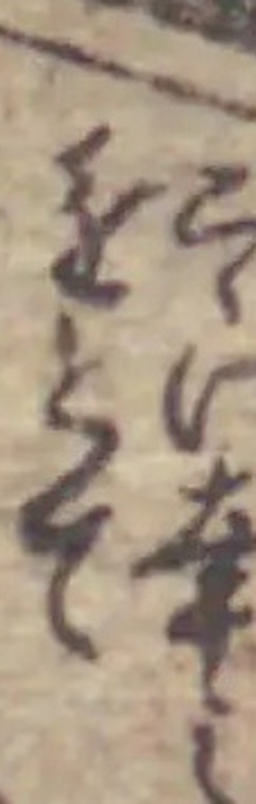進とて
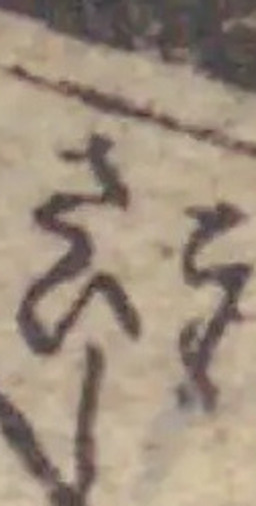さいし
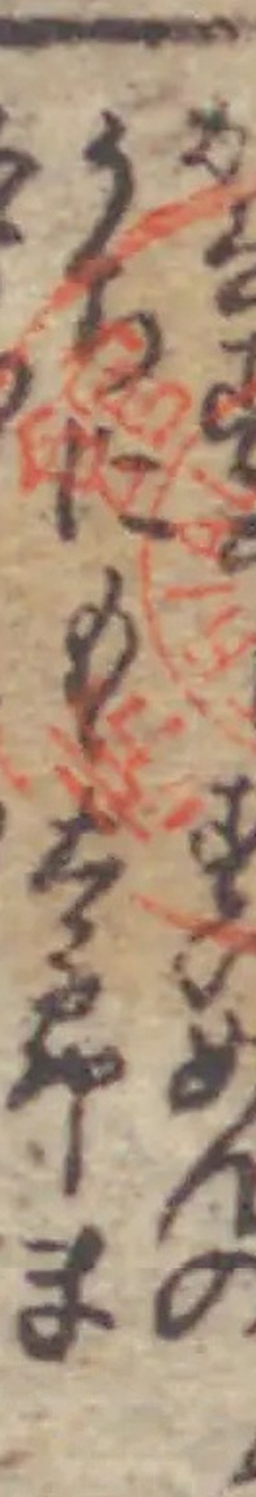うちにもゝ太郎ま
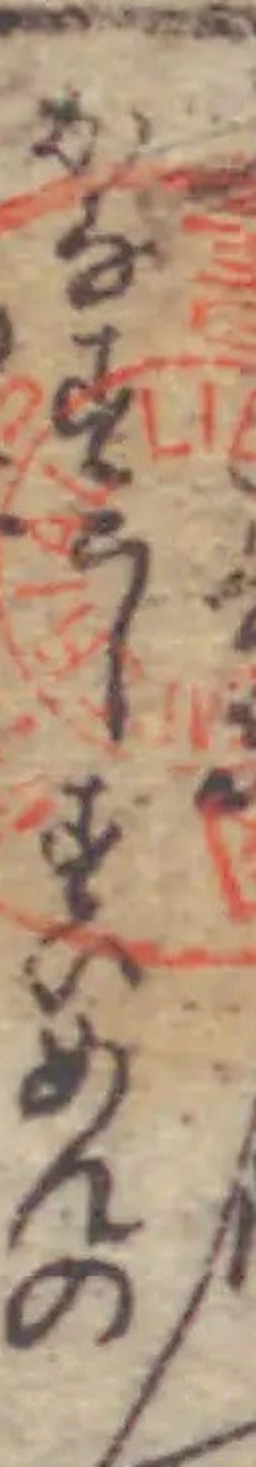かなすこしすいめんの
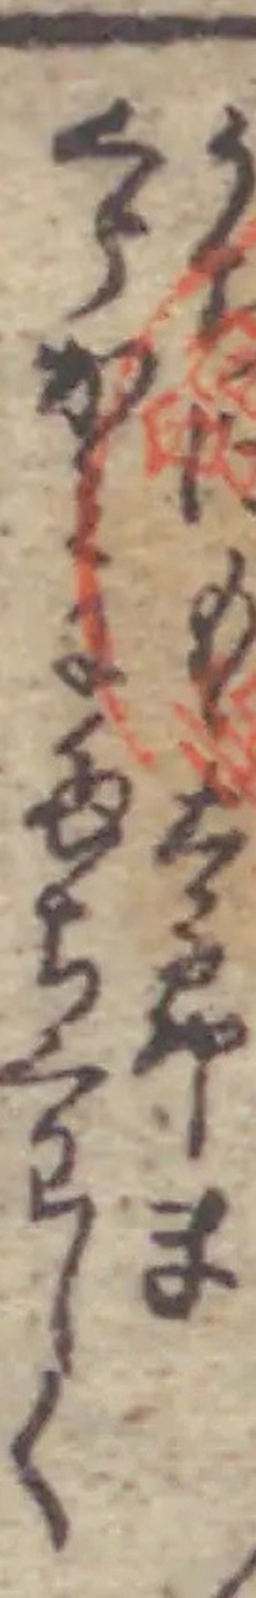くらかみにたちくわしく
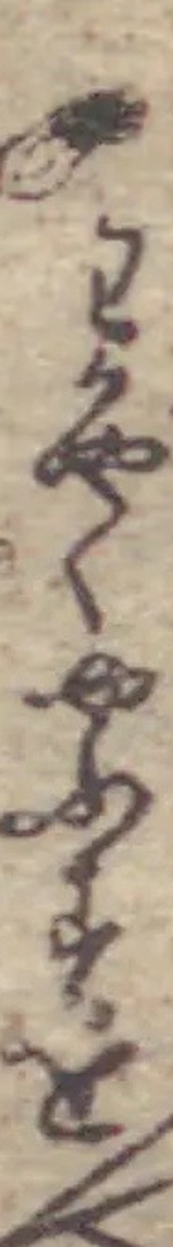わかやくやふすを

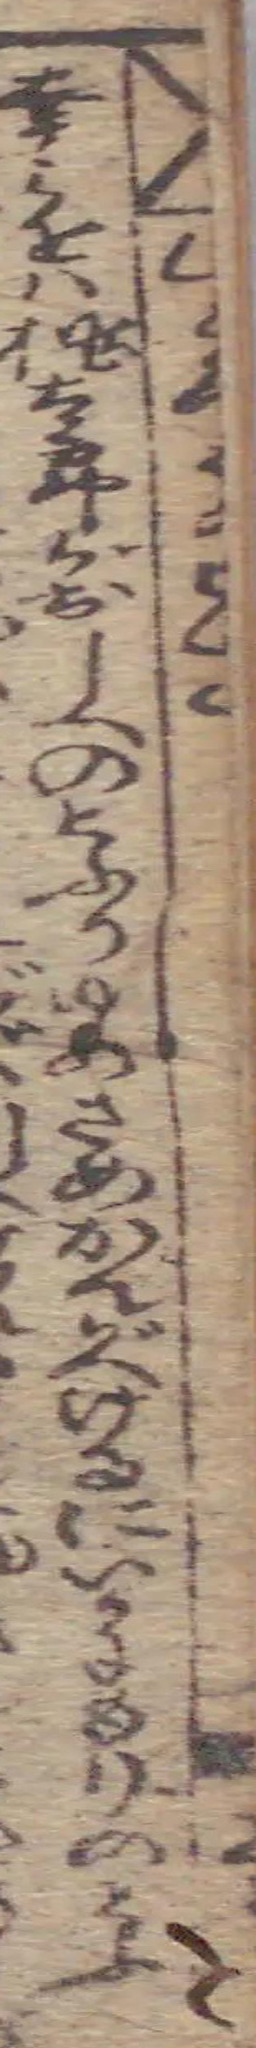幸之進をは桃太郎がおしへのとふりゆめさめかんがへけるにいかにもりのとふ
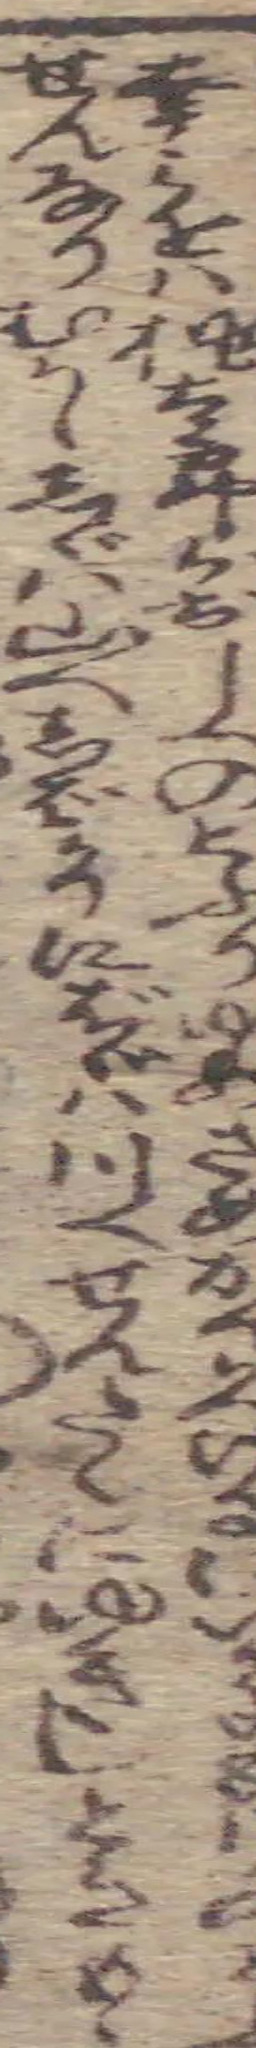せんなりむかししゞは山へしばかりにばゞは川へせんたくにゆきしときもゝ
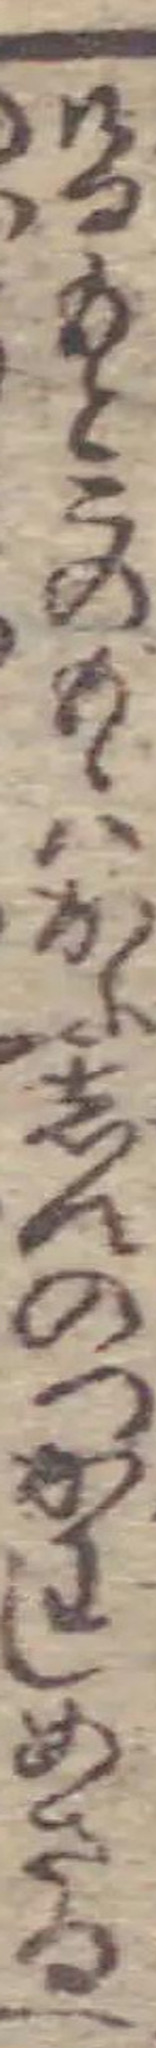けるもとこのもゝはかふしんのつかわしめさる
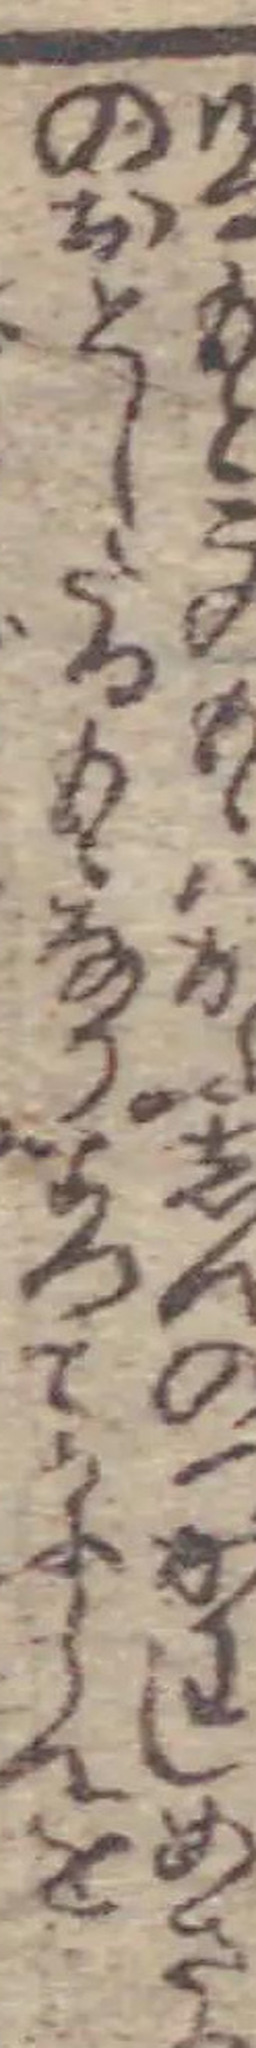のおとしたるもゝなりよつてかふしんを
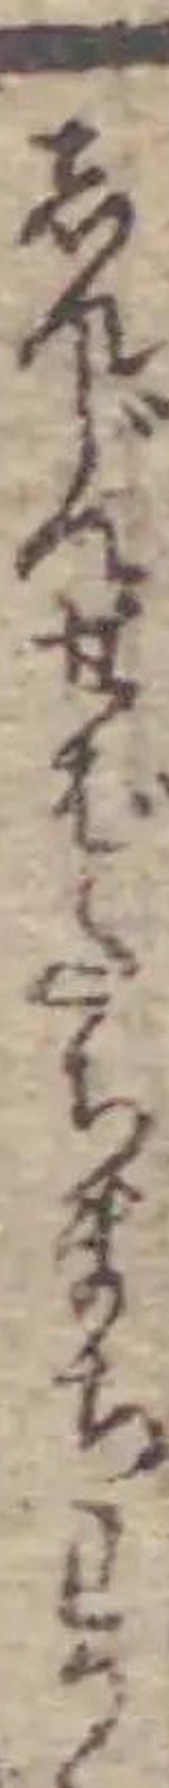しんじんせばたちまちわかく
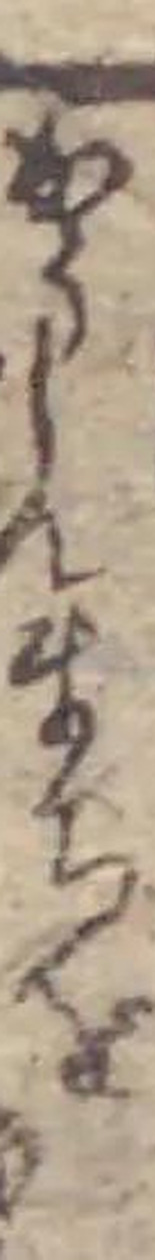かうしんまちを
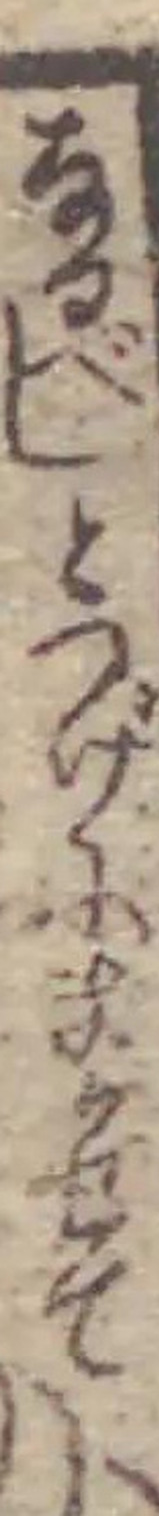なるべしとつげにまかせて
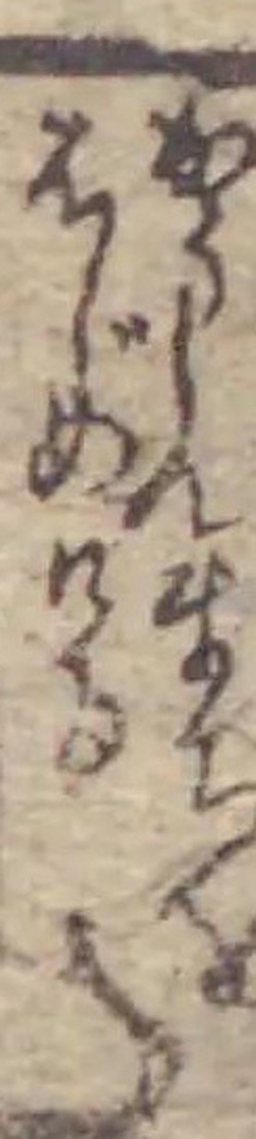はじめける
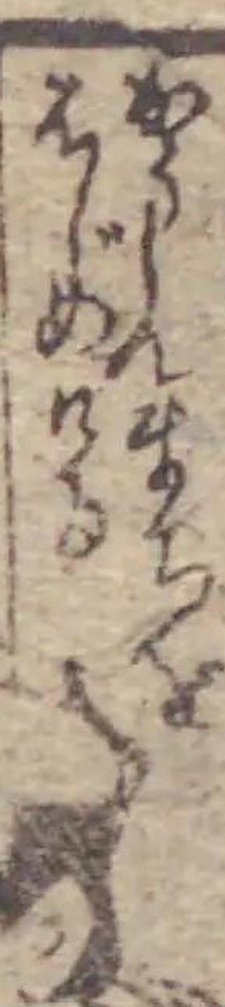はじめける
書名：日待御利生此ごろ噂 3巻
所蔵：国立国会図書館 National Diet Library, JAPAN
